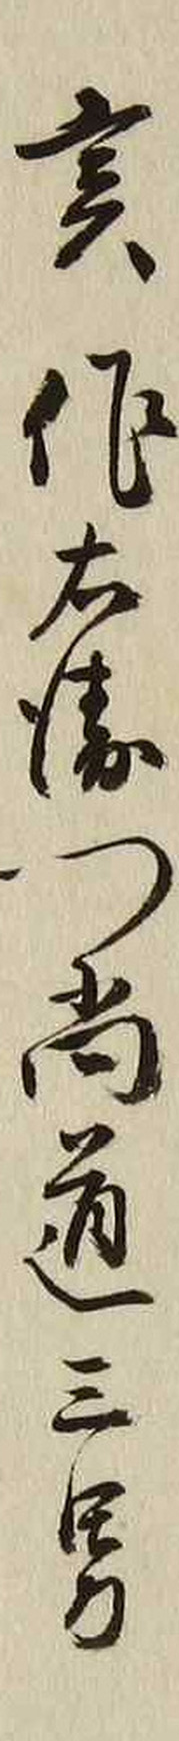実作右衛門尚道三男
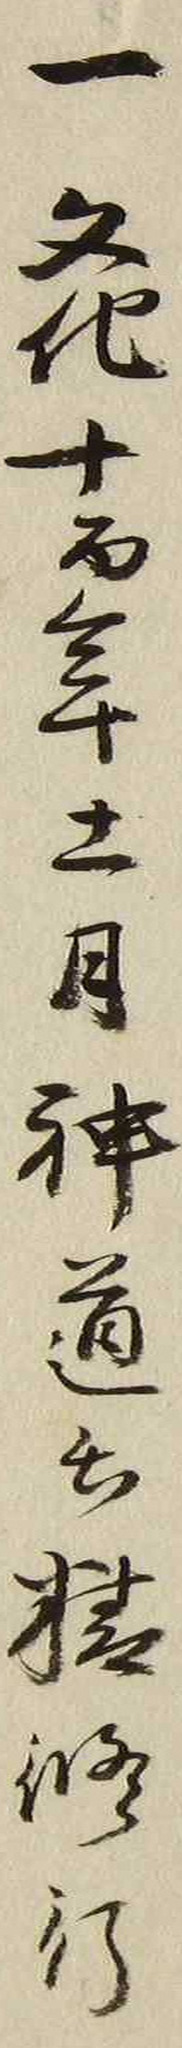一文化十酉年十一月神道出精修行
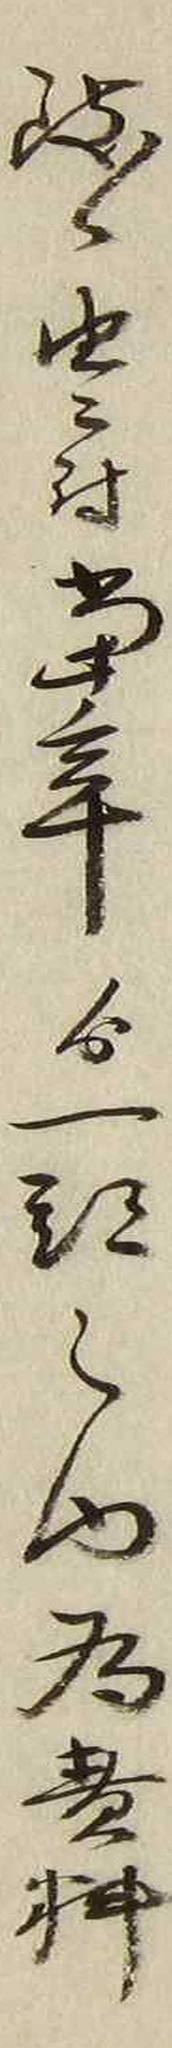致候由ニ付当年ゟ一頭之内為責料
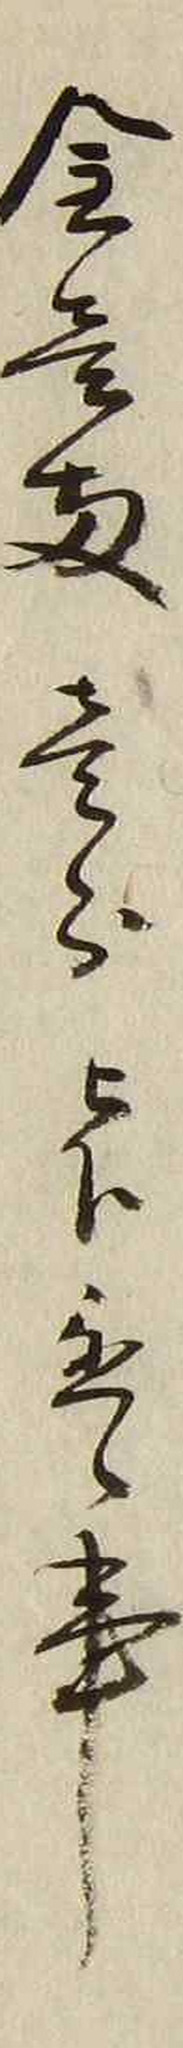金壱両壱分被下置候事
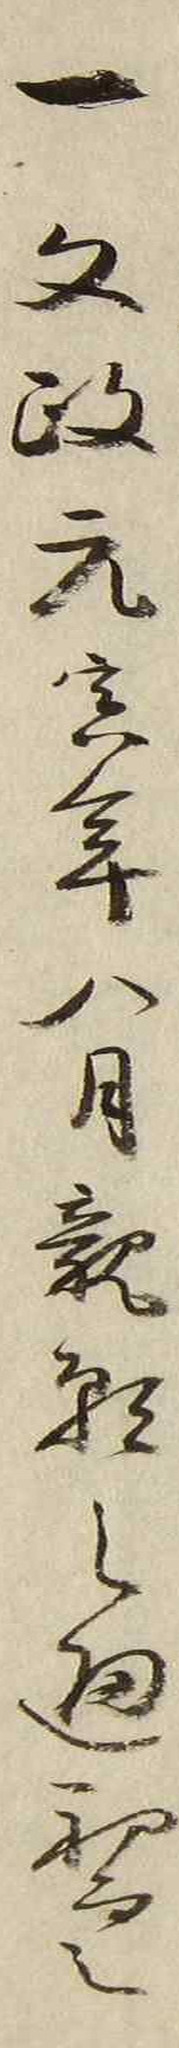一文政元寅年八月親願之通初而之

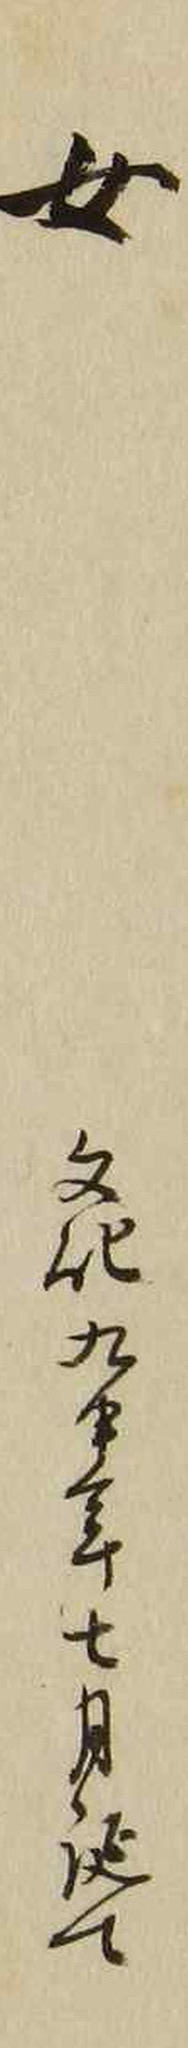女文化九申年七月誕生
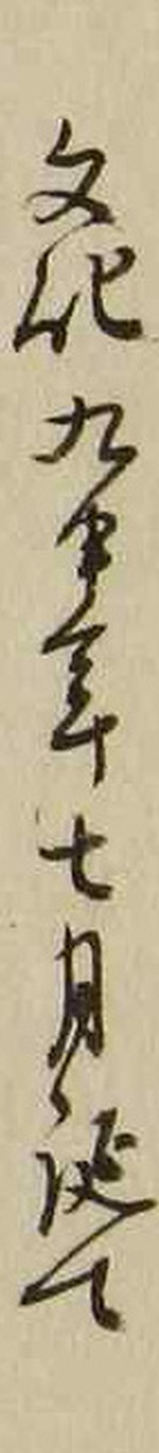女文化九申年七月誕生
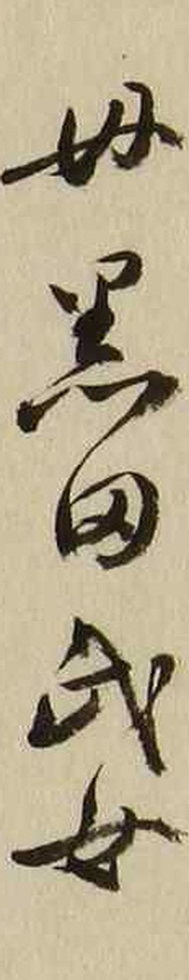母黒田氏女
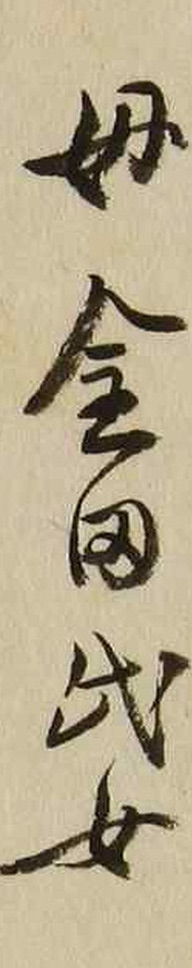母金田氏女
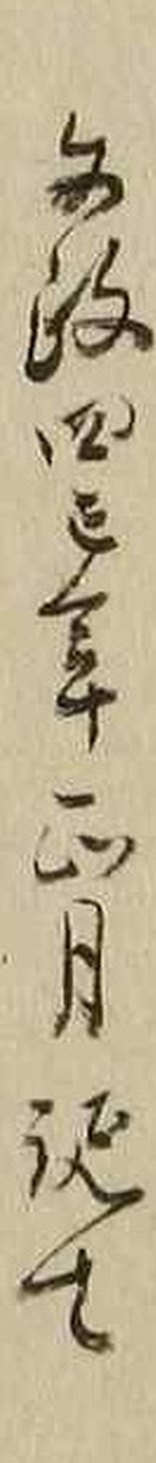女文政四巳年正月誕生
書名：諸士系譜　巻之291　さ之部23
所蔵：会津若松市立会津図書館
